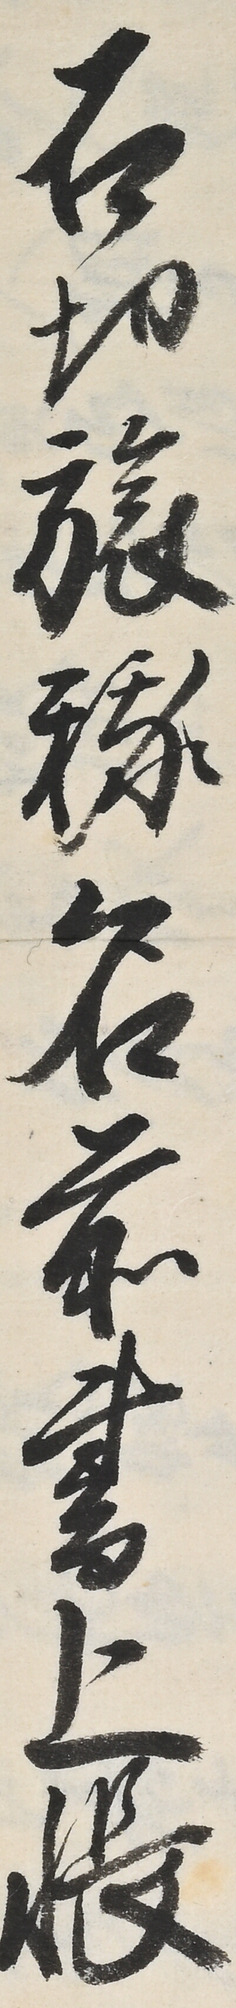石切旅稼名前書上帳
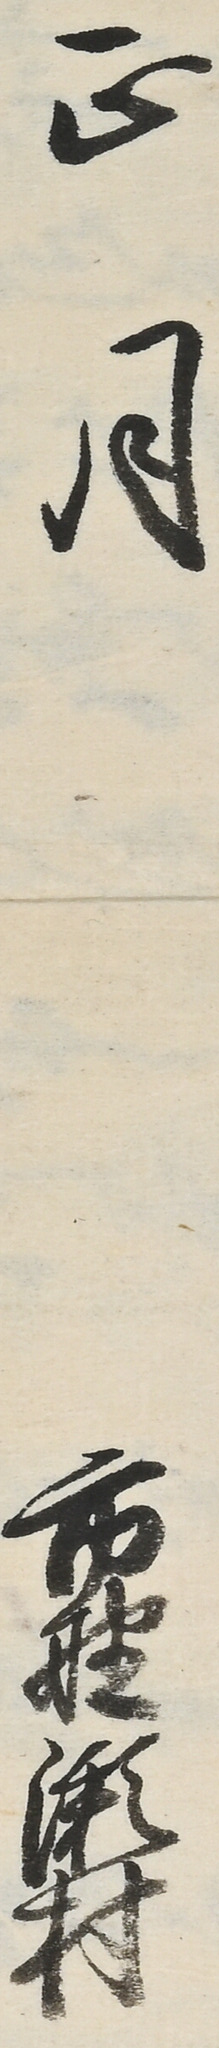正月市野瀬村

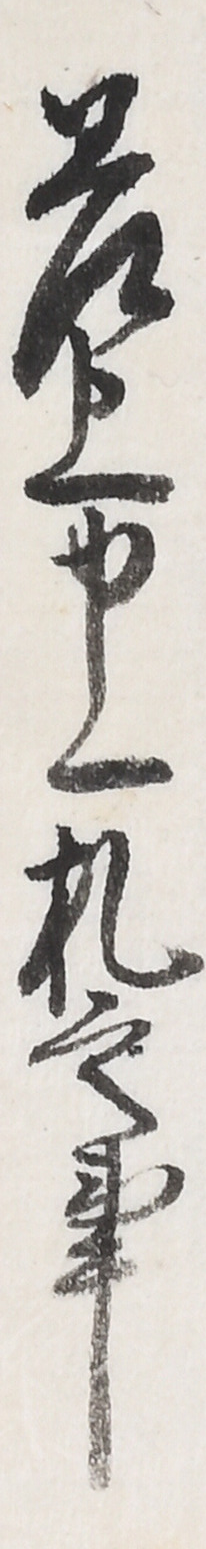差上申一札之事
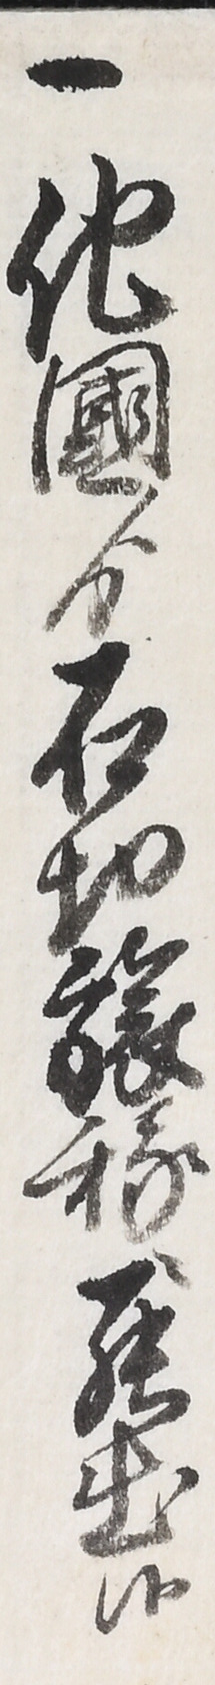一他国より石切旅稼罷出候
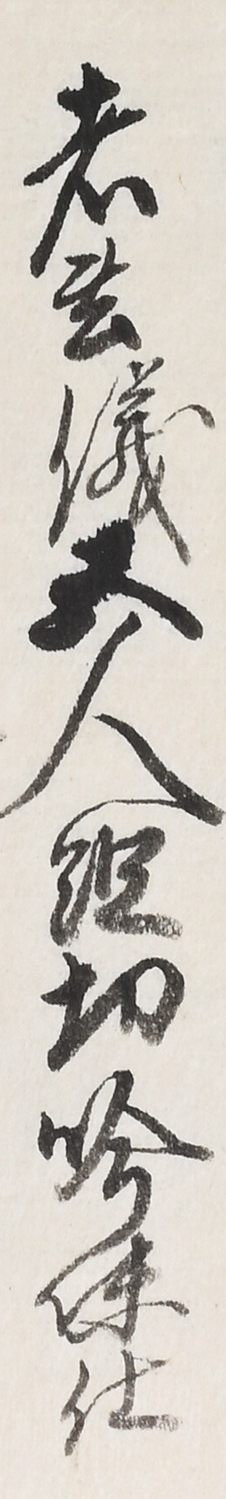者共儀五人組切吟味仕
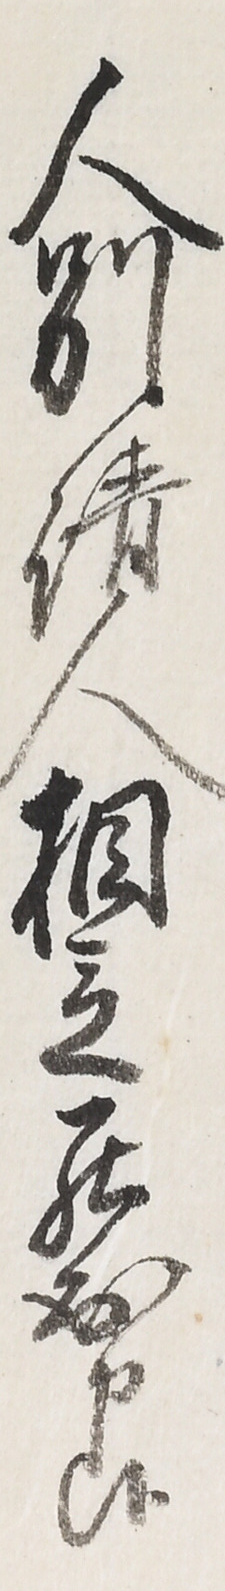人別請人相立罷出申候
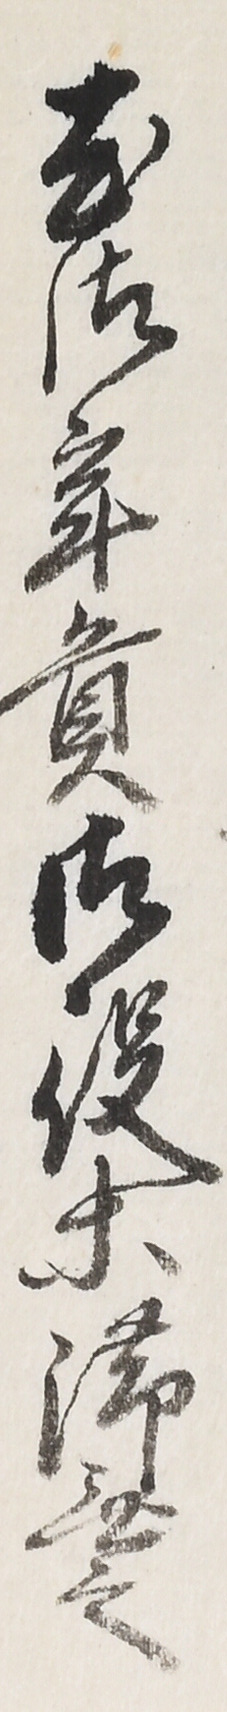尤御年貢御役等滞無之
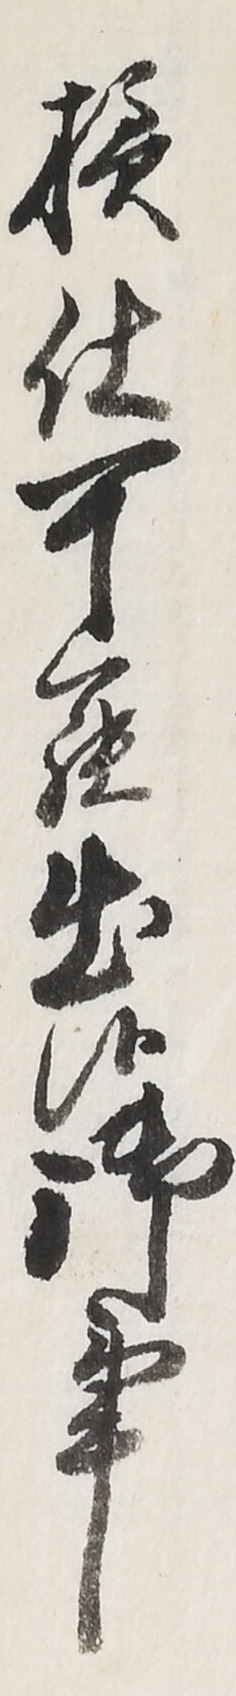様仕可罷出候御事
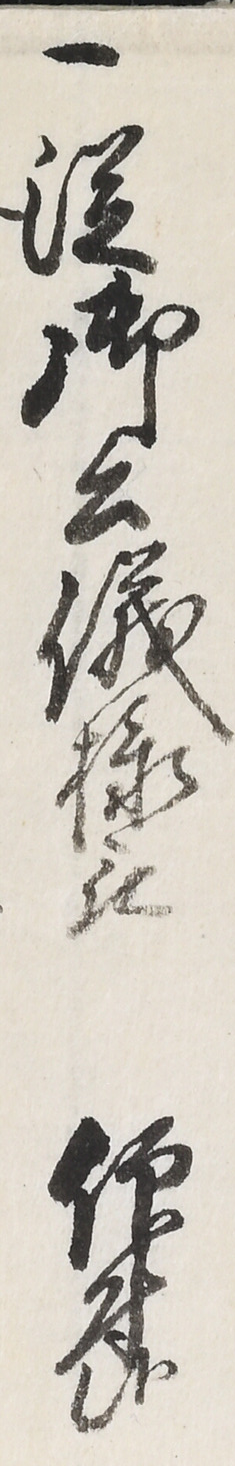一従御公儀様被仰付候
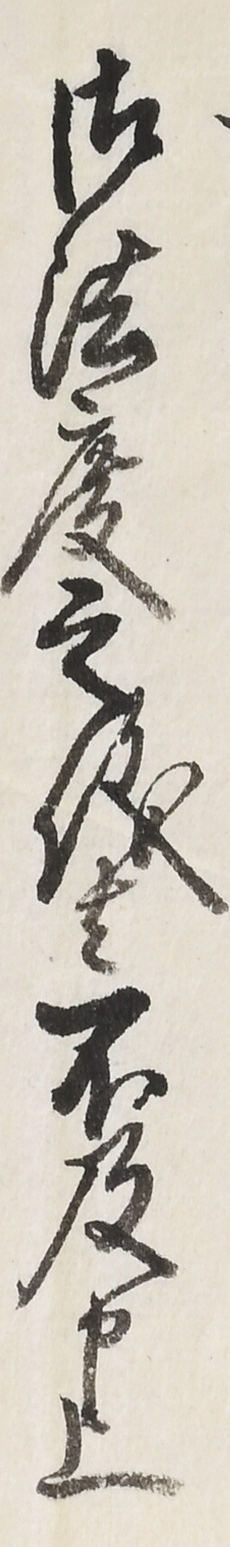御法度之儀は不及申上
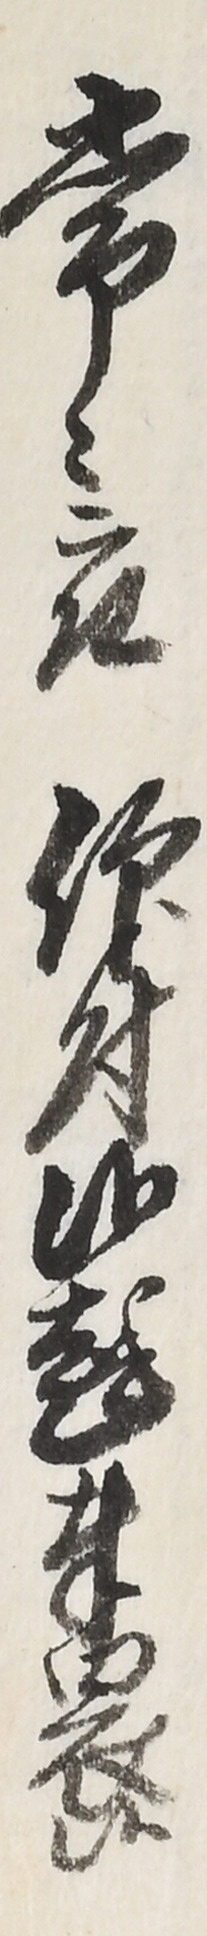常々被仰付候趣奉畏候
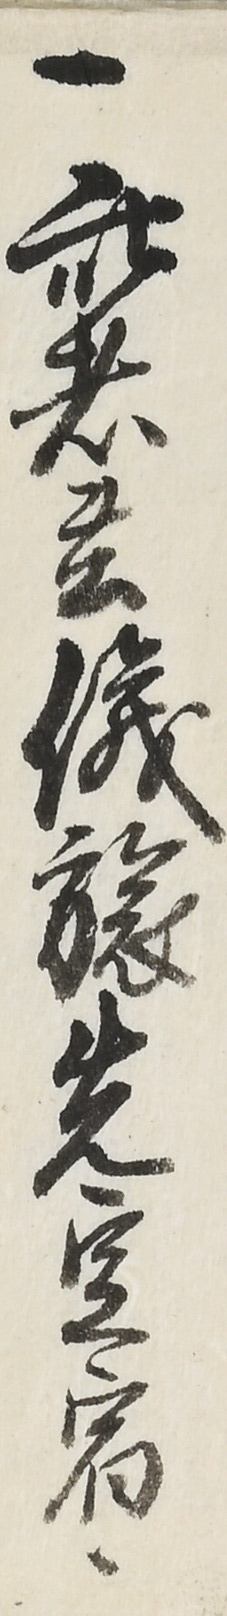一此者共儀旅先定宿▢
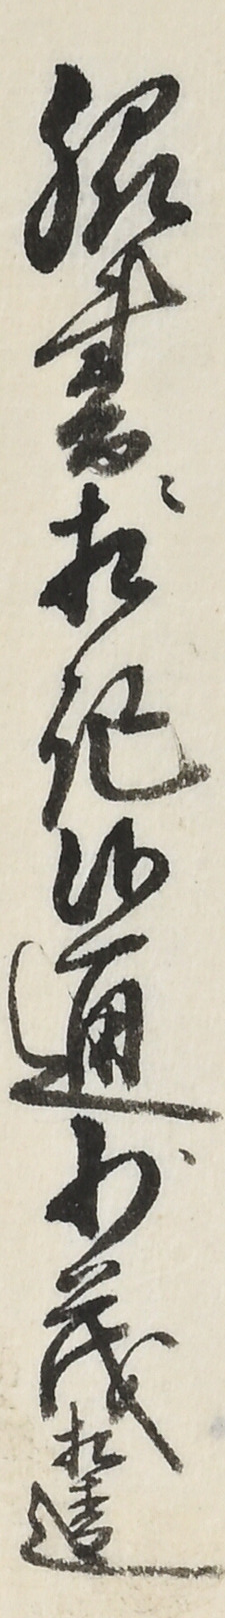脇書相記候通少も相違
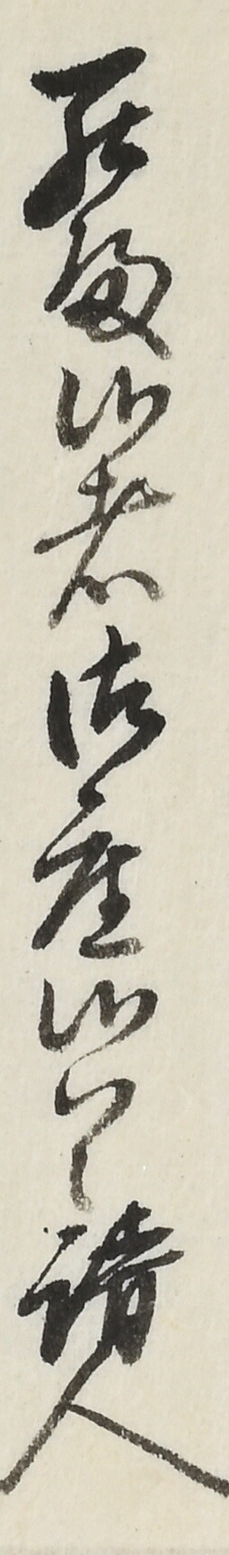罷帰候者御座候ハヽ請人

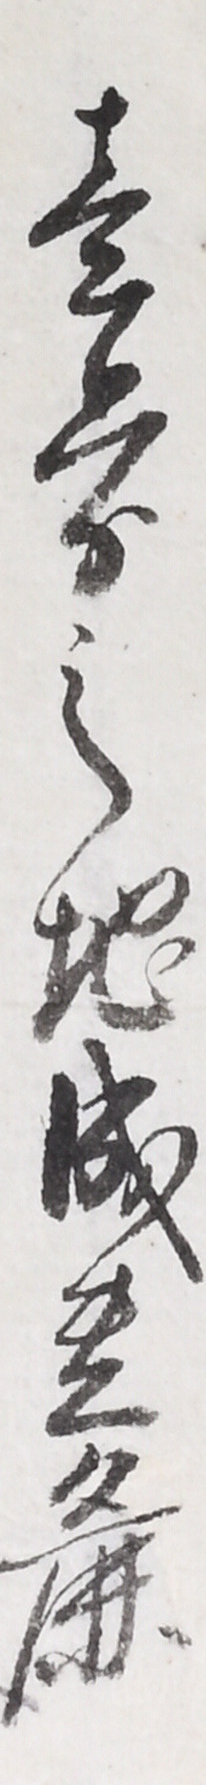壱歩之地成共麤
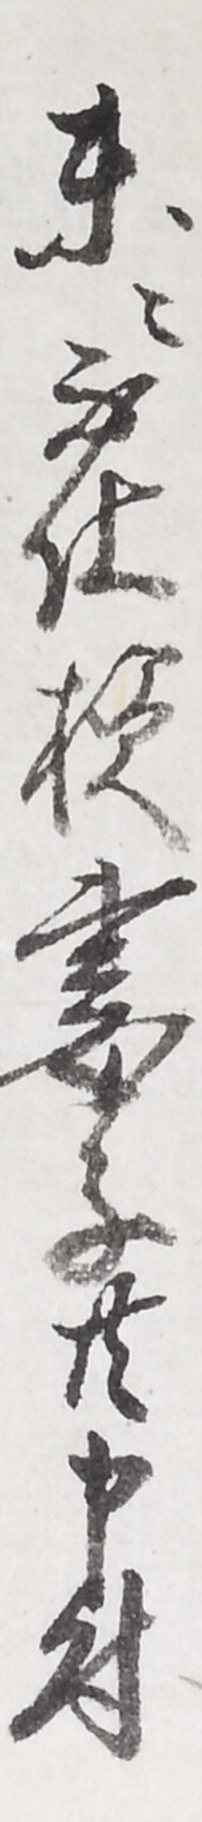末ニ不仕様妻子共申付
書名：安政六己未年正月石切旅稼名前書上帳
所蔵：伊那市立高遠町図書館・合同会社AMANE
